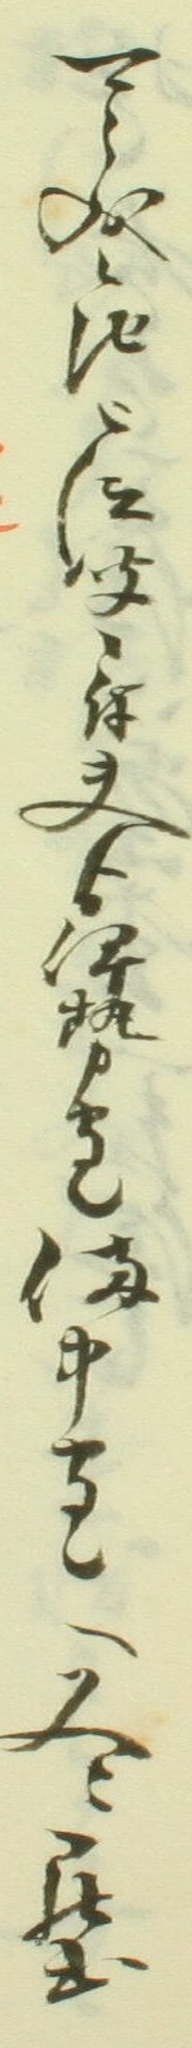可被成候由被仰聞ニ付夫ゟ伊勢守殿備中守殿へ又々罷出
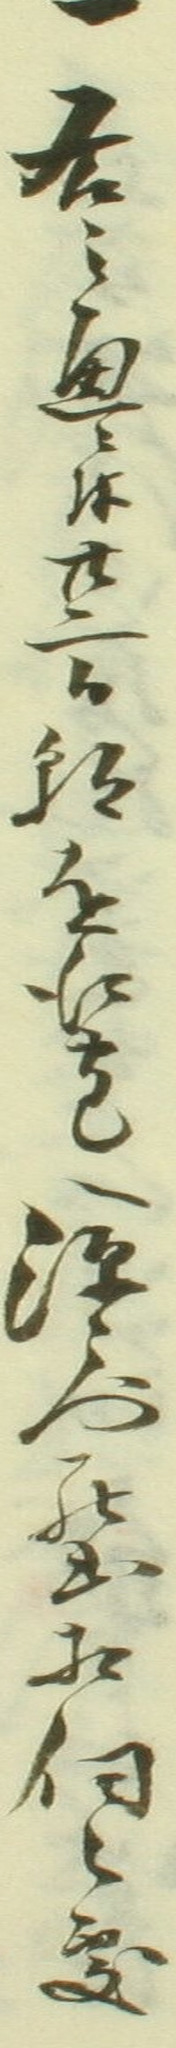一右之通ニ付廿二日朝遠江守殿へ源右衛門罷出相伺候処
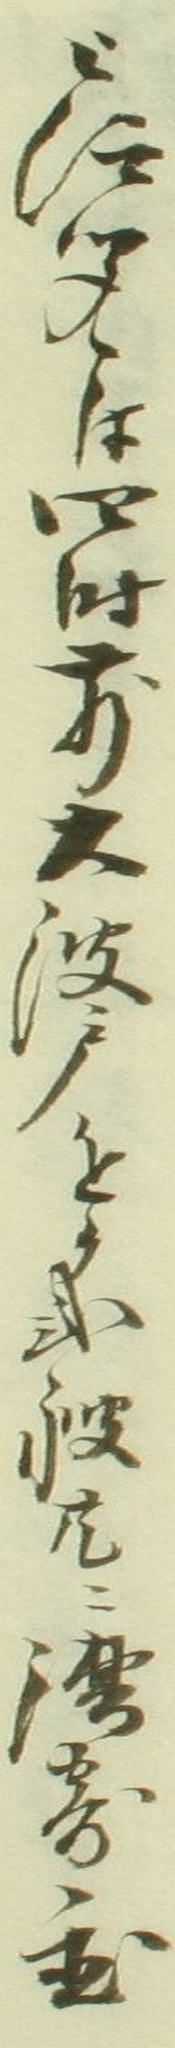被仰聞候付四時前大波戸近ク弐艘共ニ漕寄置
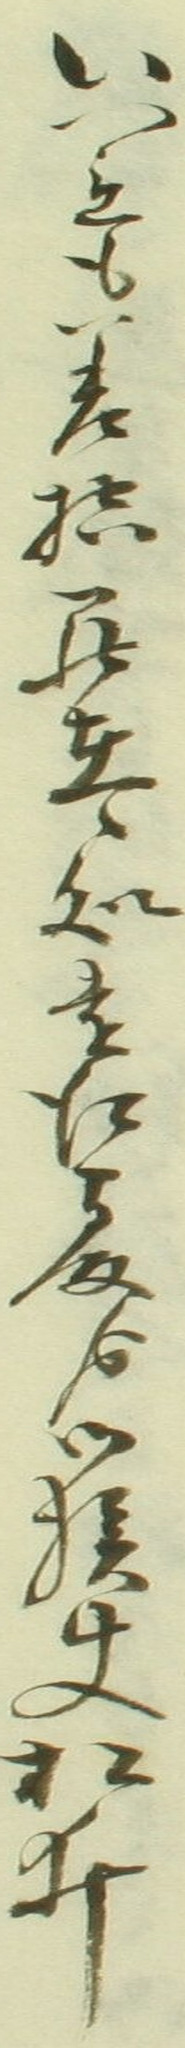いつとも差拮罷在候処遠江守殿ゟ御検使松井
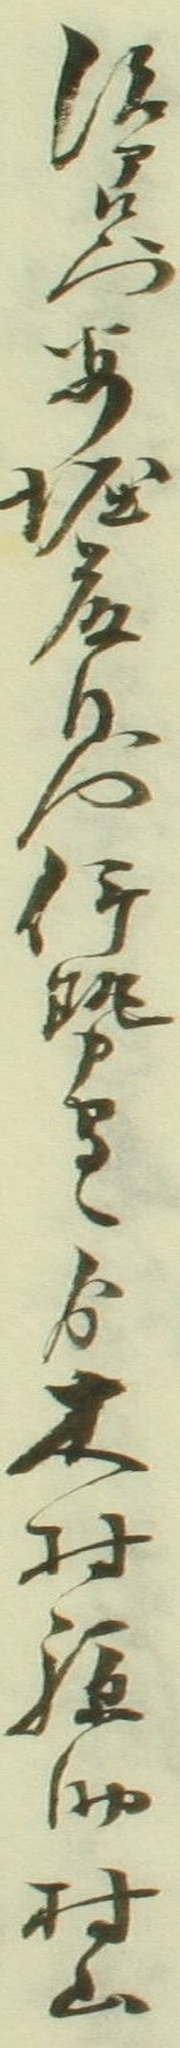治部左衛門安堀藤左衛門伊勢守殿ゟ木村孫助村山
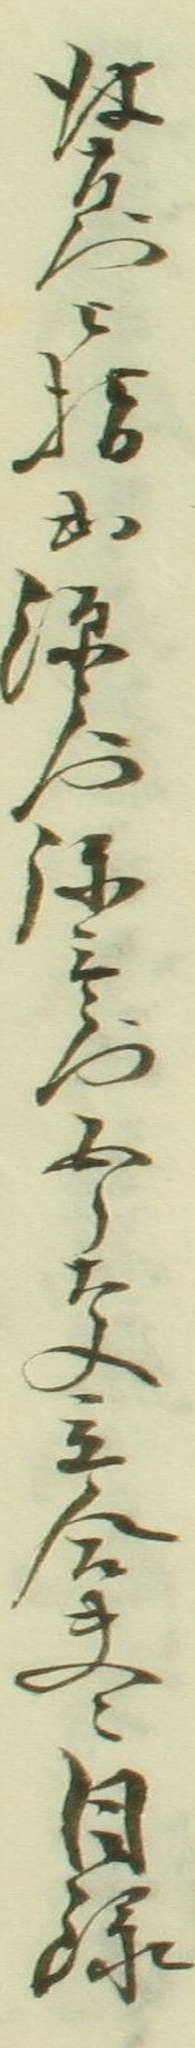儀左衛門被指出源右衛門孫左衛門五郎太夫立合夫々目録
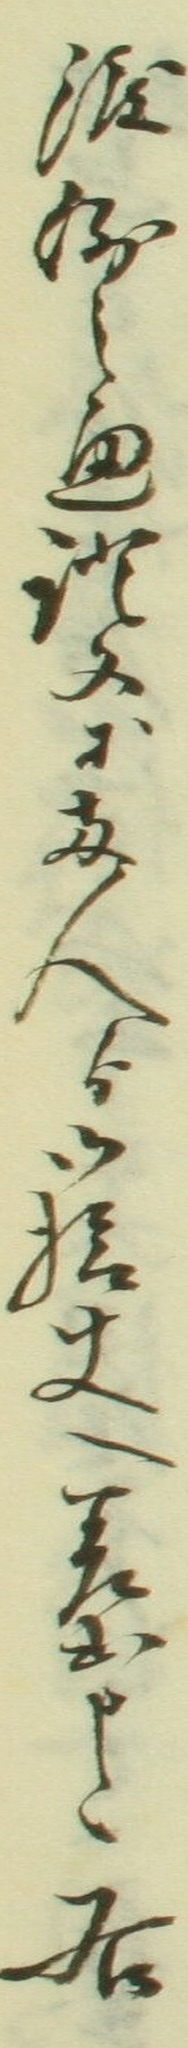渡例之通証文等両人ゟ御検使へ差出申候右

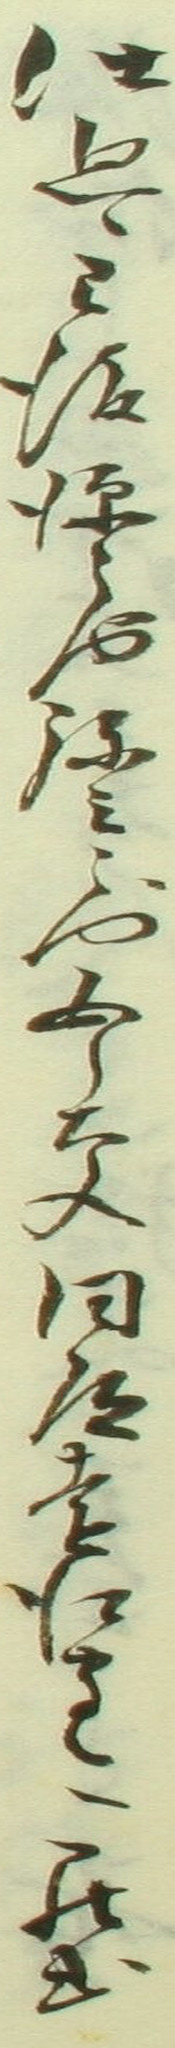仕廻候已後源右衛門孫右衛門五郎太夫同道遠江守殿へ罷出
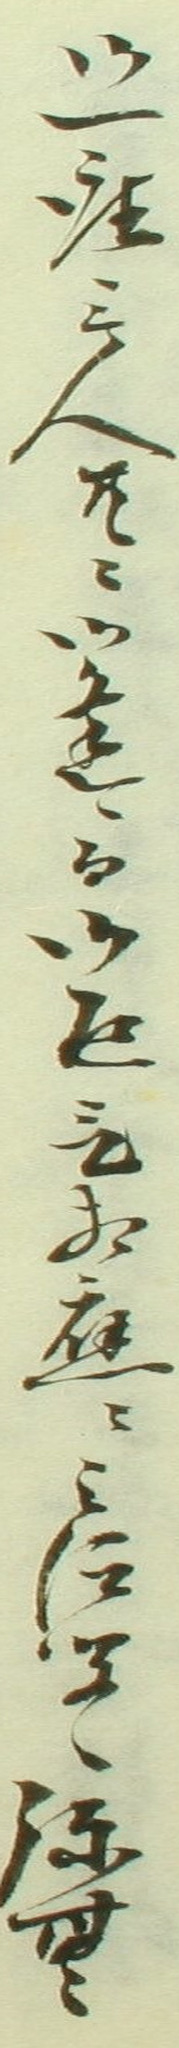御一座三人共ニ御逢候而御返言相応ニ被仰聞候弥無
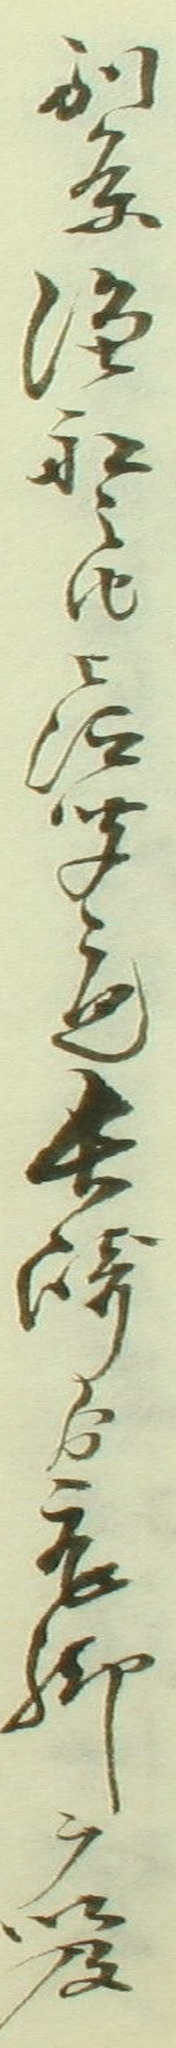別条漁船之由被仰聞候通長崎ゟ飛脚ヲ以及
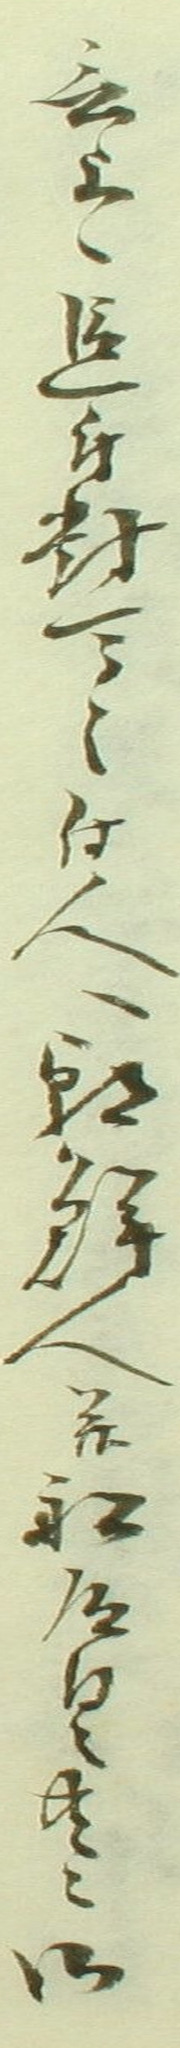言上候追付対馬之付人へ朝鮮人并船道具共ニ御
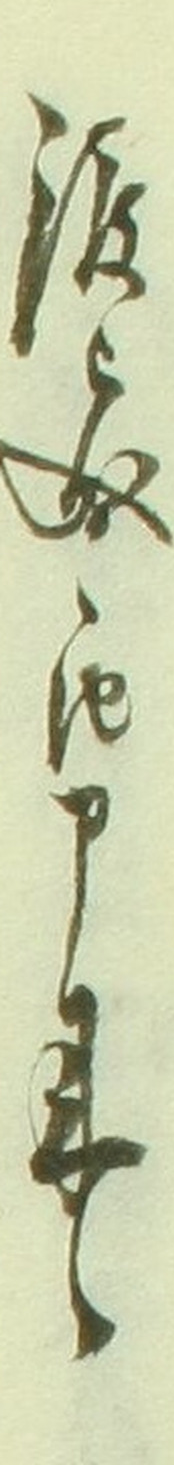渡被成候由申来候
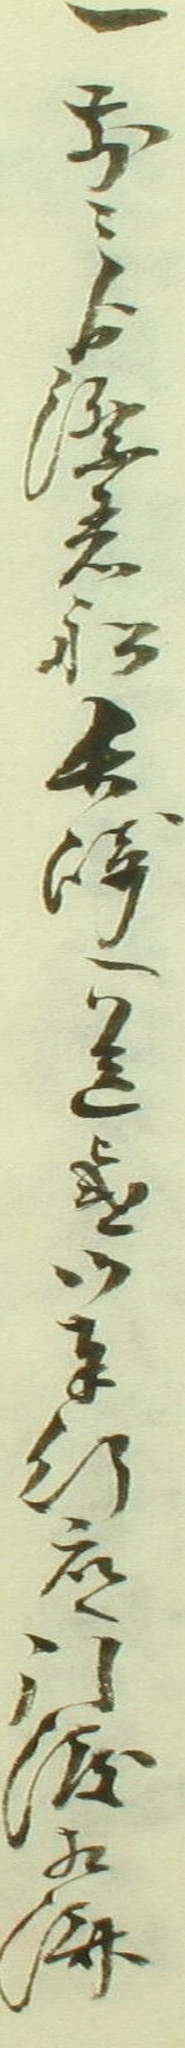一前々ゟ漂着船長崎へ送被遣御奉行衆へ引渡相済
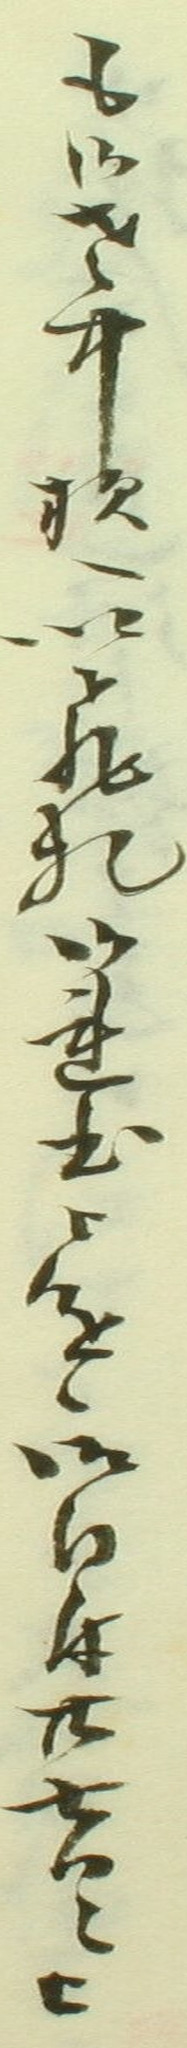も御老中様へ御飛札御連書被進候御日付廿七日と被
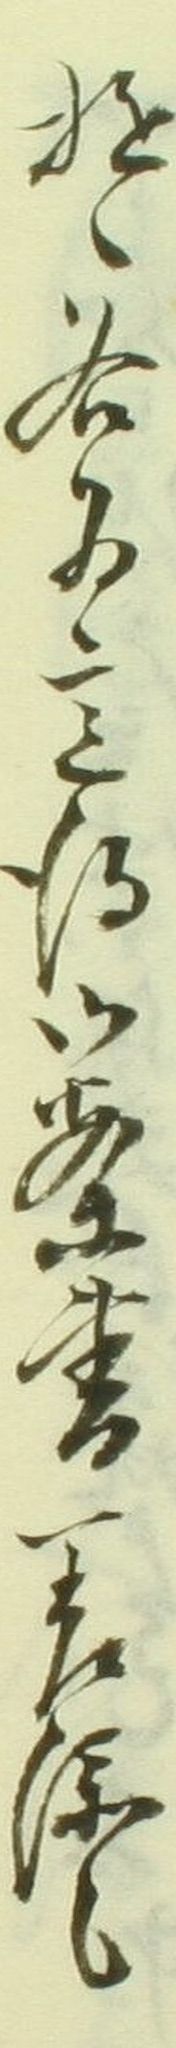遊候各為意得御案書差添候
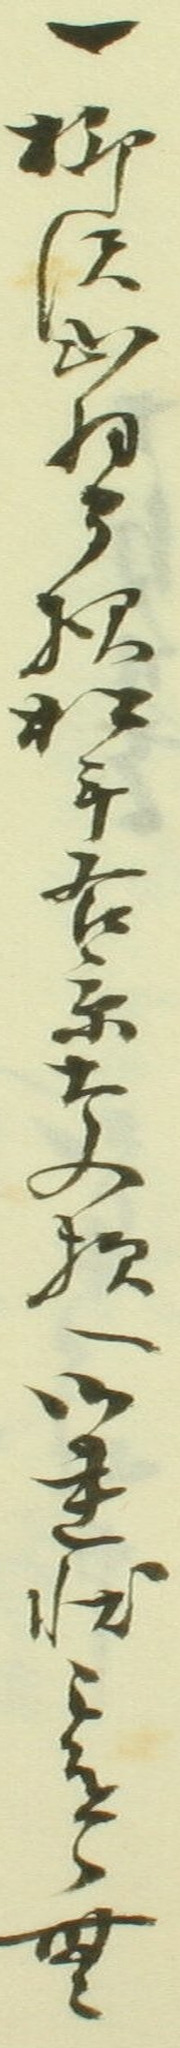一柳沢出羽守様松平右京大夫様へ御連状被進候無
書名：異国船漂着記
